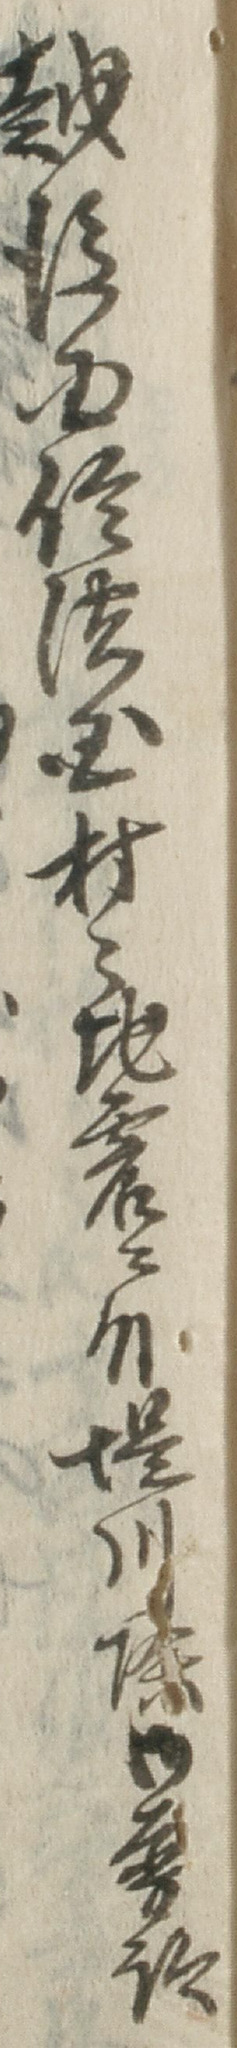越後国信濃国村々地震二付堤川除御普普請
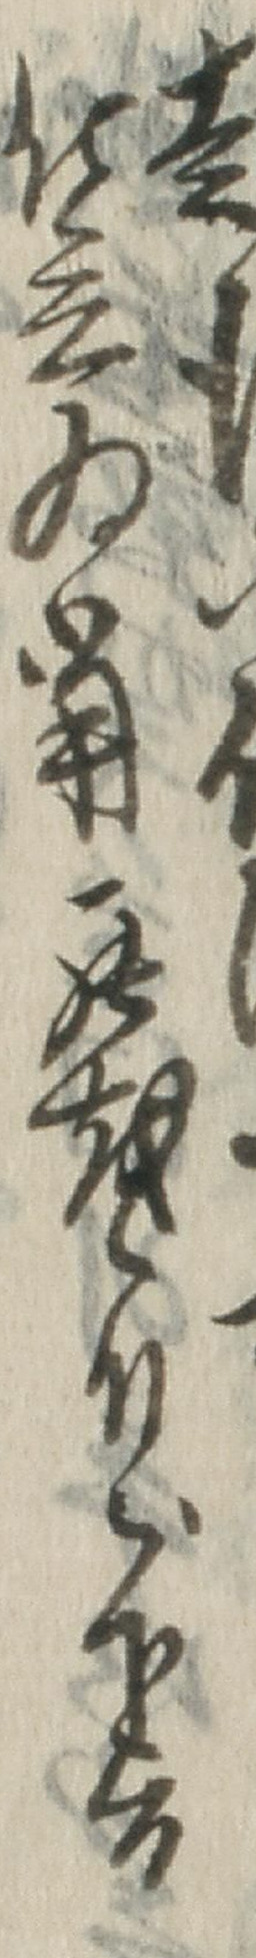仕立為御用罷越候付被下候旨
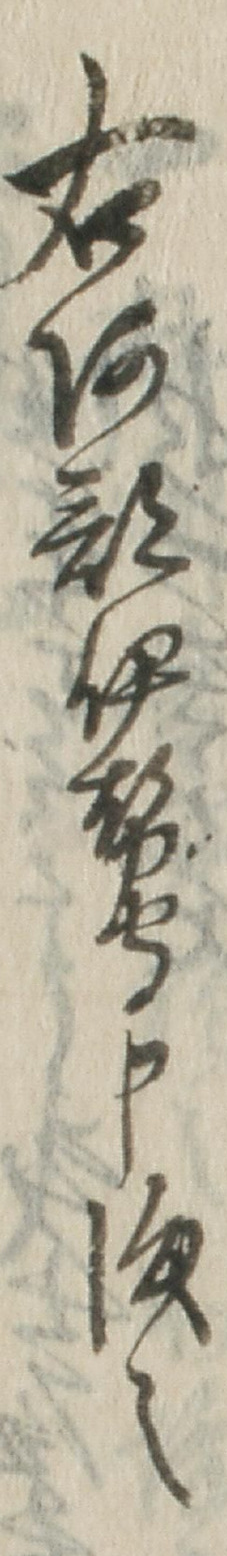右阿部伊勢守申渡之
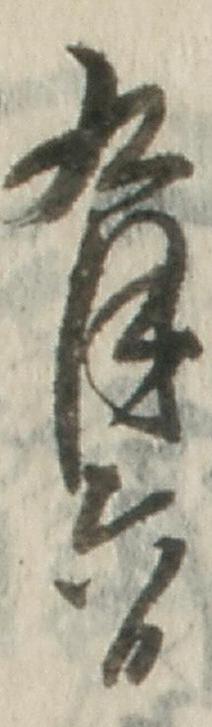九月六日
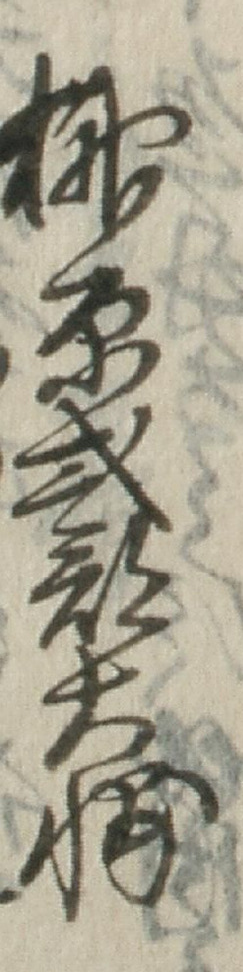榊原式部大輔
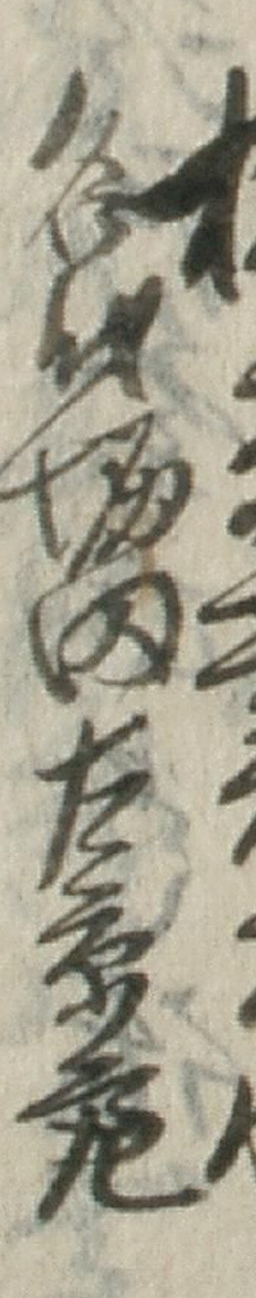名代堀内左亰亮
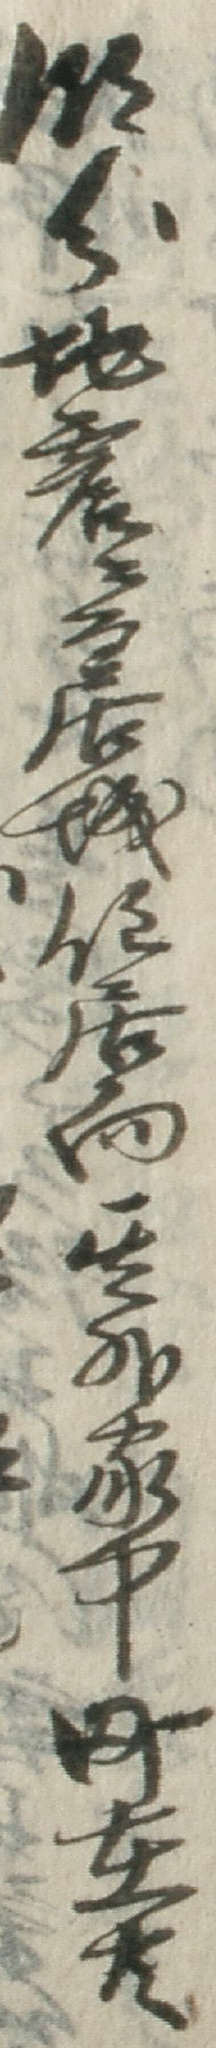領分地震二而居城住居向其外家中町在共
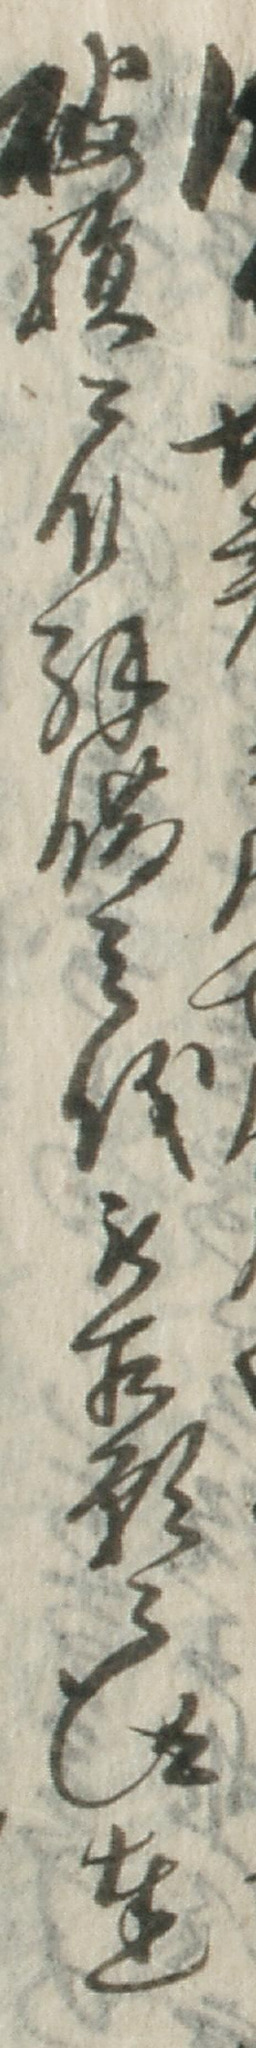破損二付拝借之儀被相願候趣達
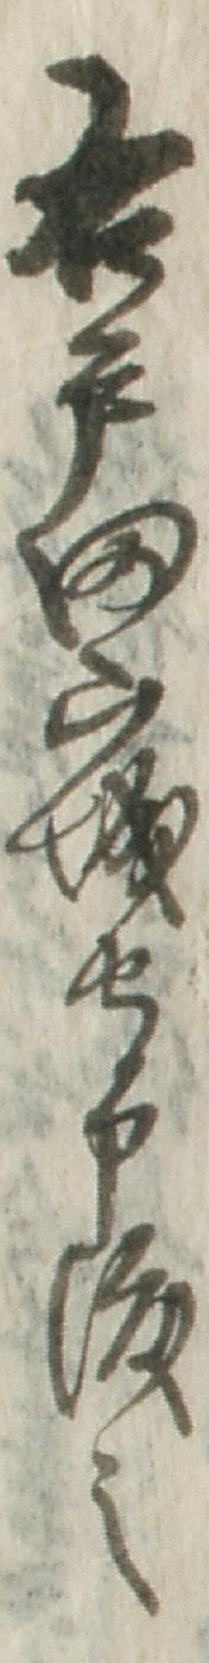右戸田山城守申渡之
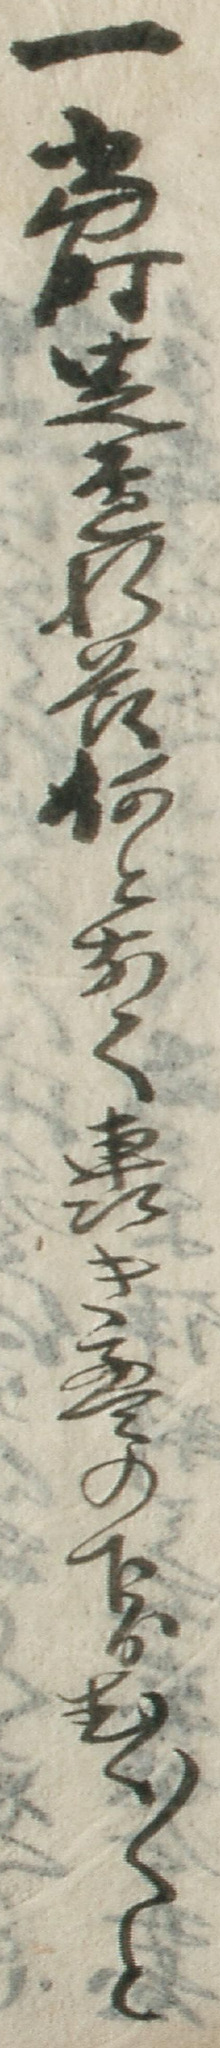一当時是？辺折節何となく響キ畳の下ゟむく〳〵と

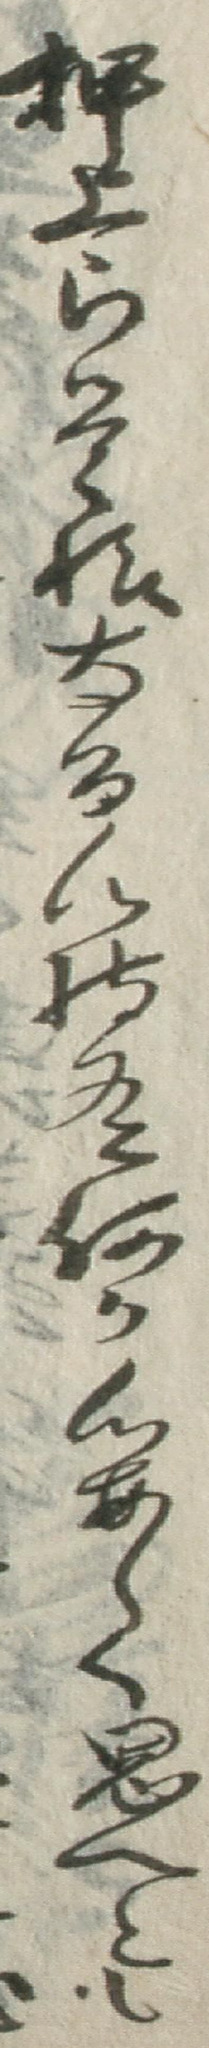押上らる？様なる心持有何か心あしく思へとも
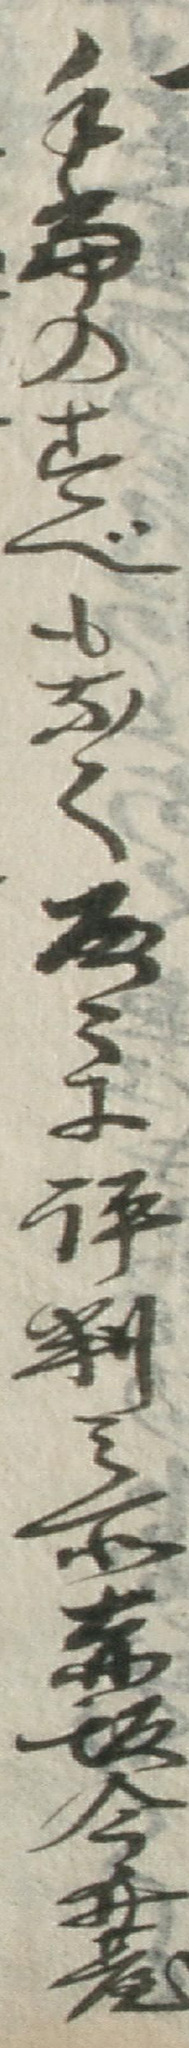手当のすべもなく取々に評判之所赤坂今井臺
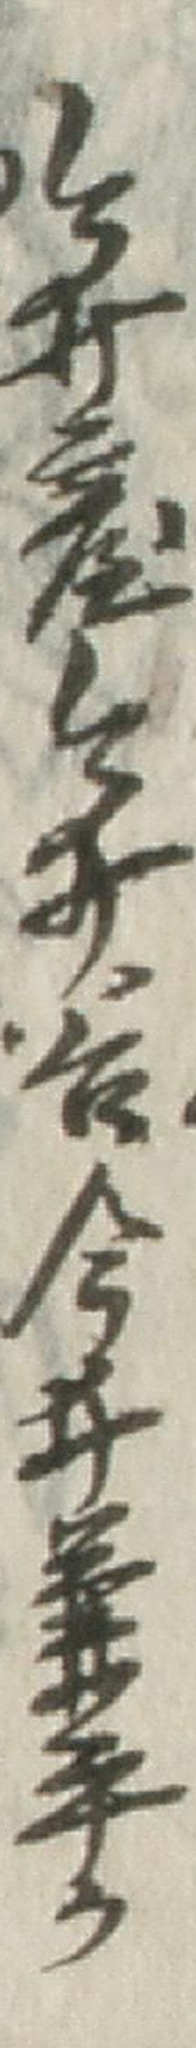今井臺今井台今井兼平の
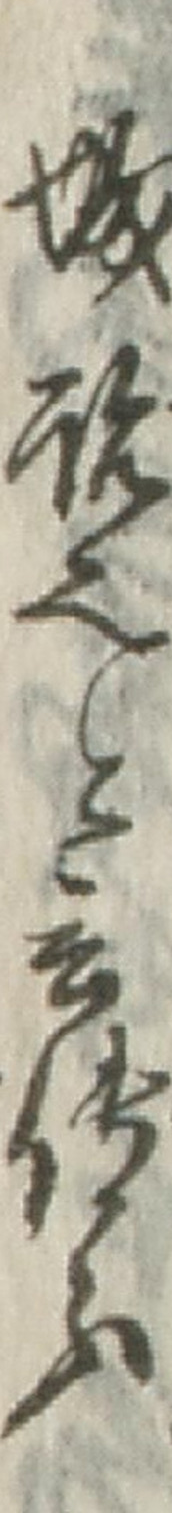城跡と云伝ふ
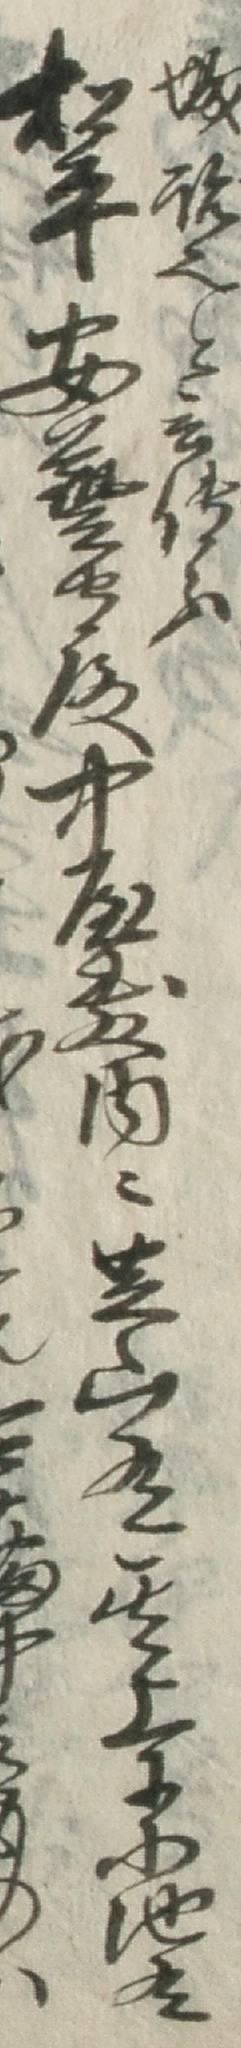松平安芸守殿中敷内二芝山有其上に小池有
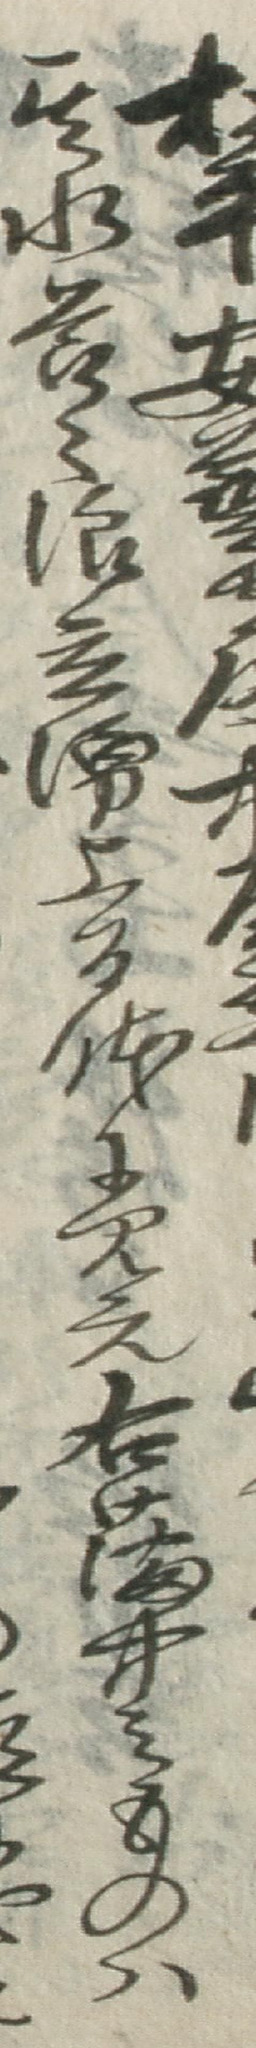其水善々浪立湧上る躰に見え右藩中之ものハ
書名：信濃國地震實録記
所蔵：東京大学地震研究所図書室 Earthquake Research Institute Library, The University of Tokyo, JAPAN
